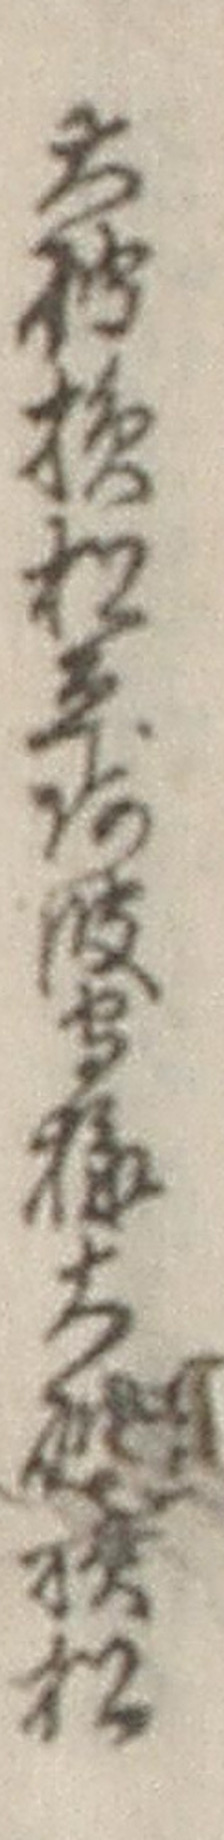大破損松平阿波守様大破損松
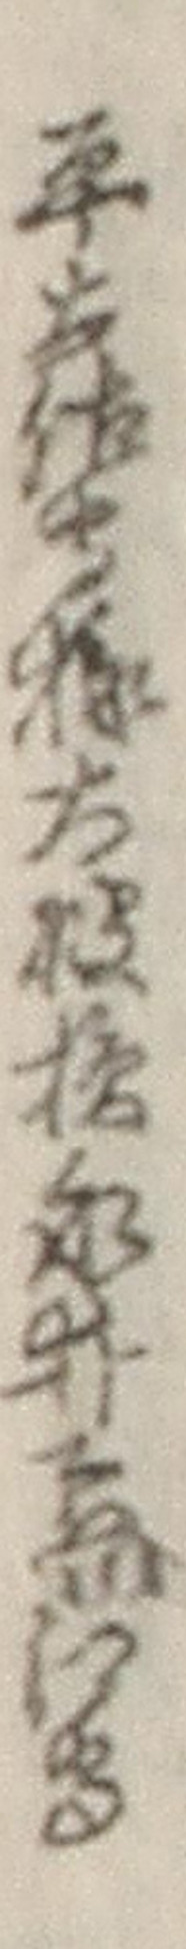平土佐守様大破損永井遠江守
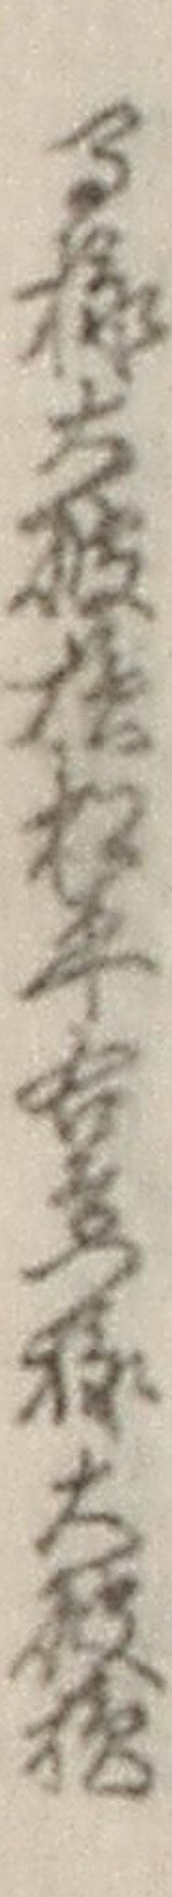守様大破損松平吉右衛門様大破損
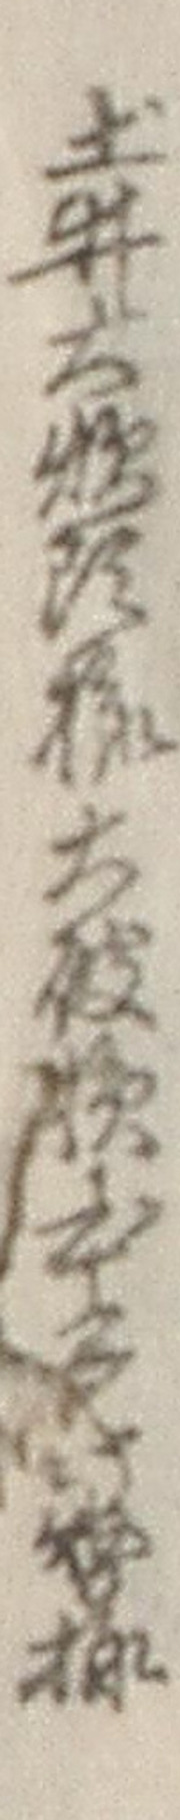土井大炊頭様大破損本多伊勢様
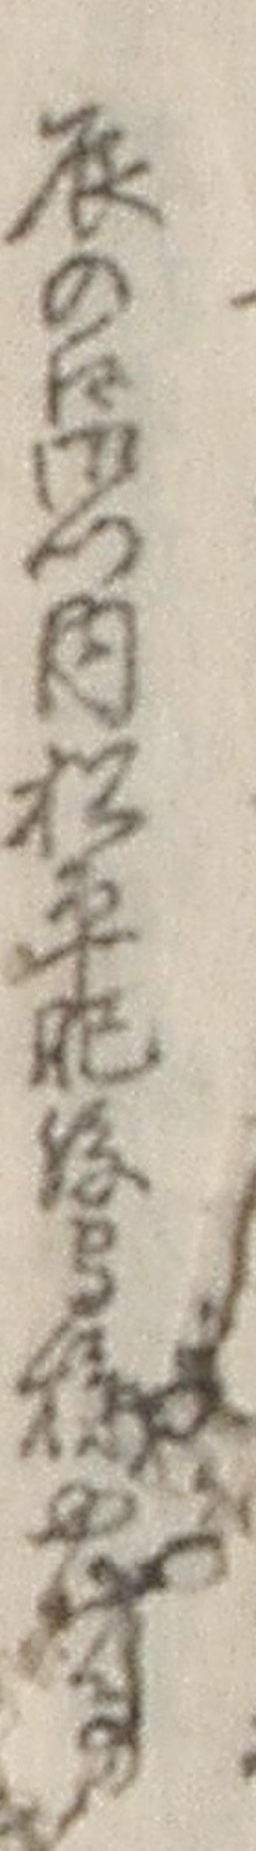辰の口御門内松平肥後守様やける
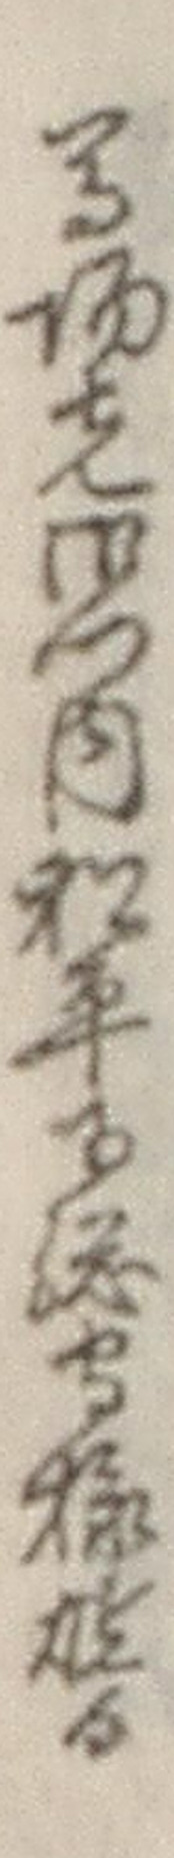馬場先御門内松平下総守様焼る
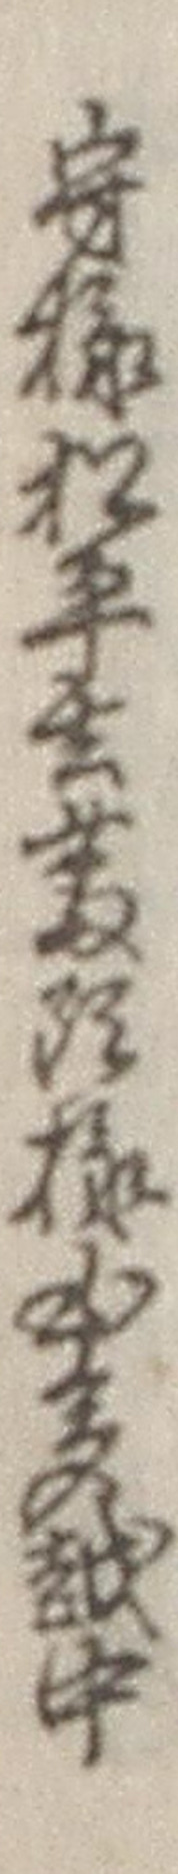守様松平玄蕃頭様本多越中
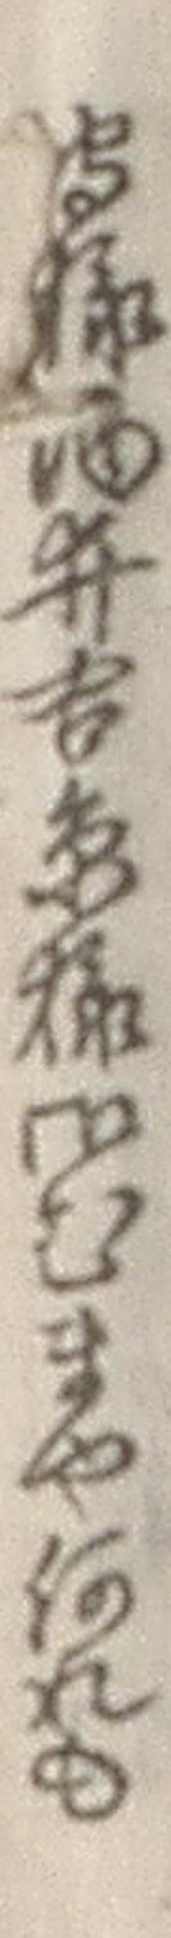守様酒井右京様御むまや何れも
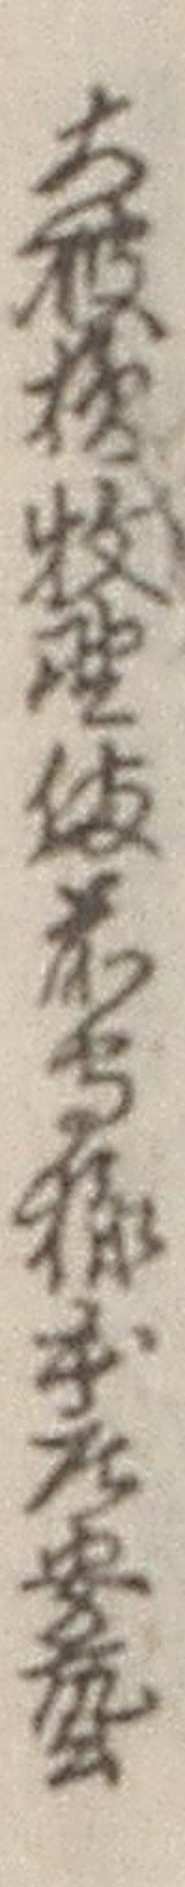大破損牧野備前守様本庄安芸
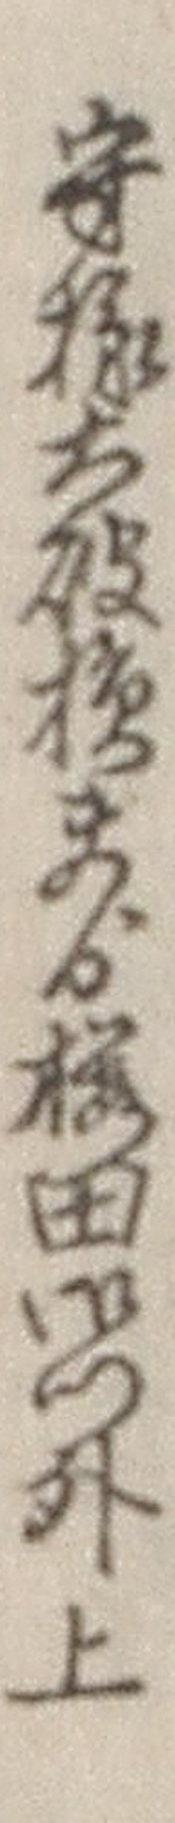守様大破損夫ゟ桜田御門外上
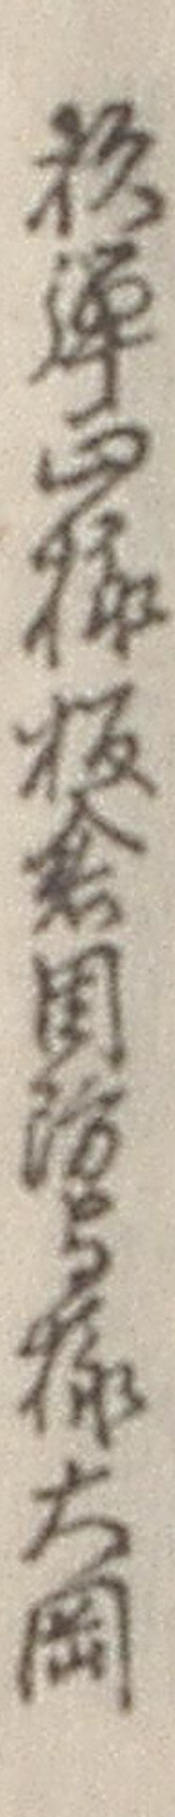杉弾正様板倉周防守様大岡
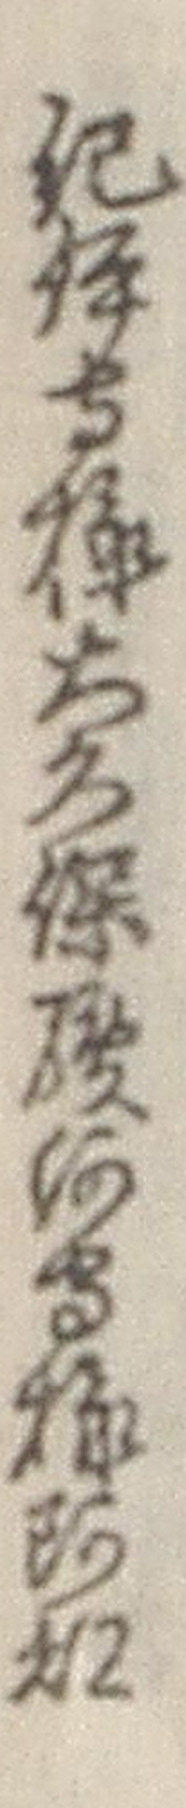紀伊守様大久保駿河守様阿部
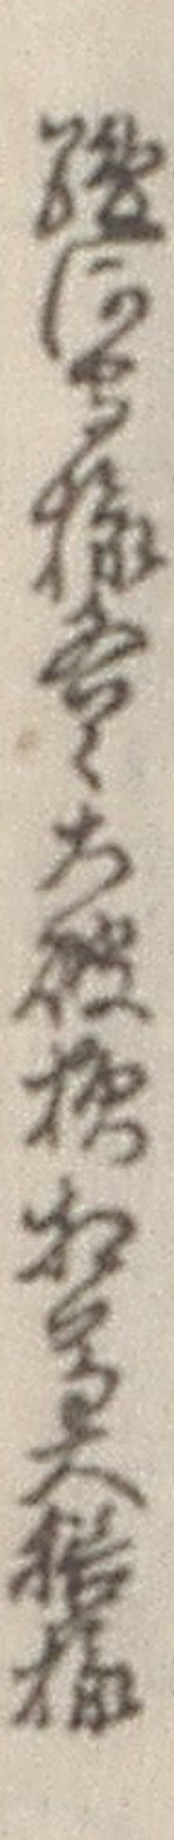駿河守様各々大破損相馬大膳様
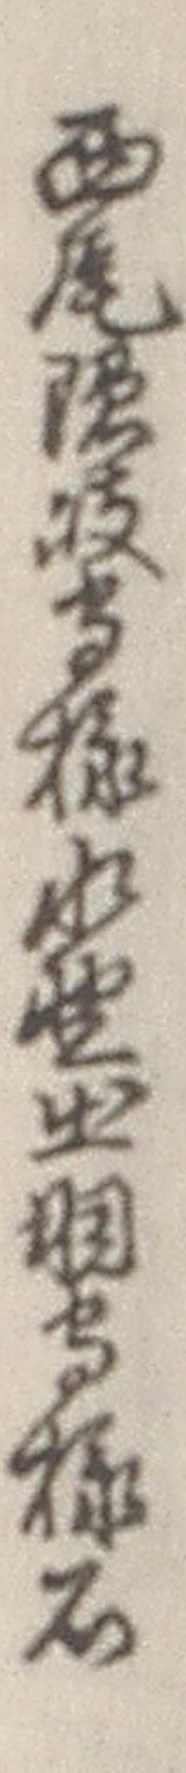西尾隠岐守様水野出羽守様石
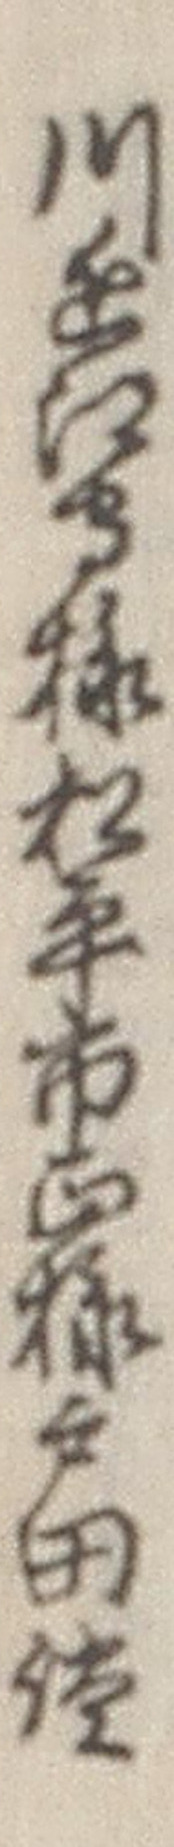川近江守様松平市正様戸田淡
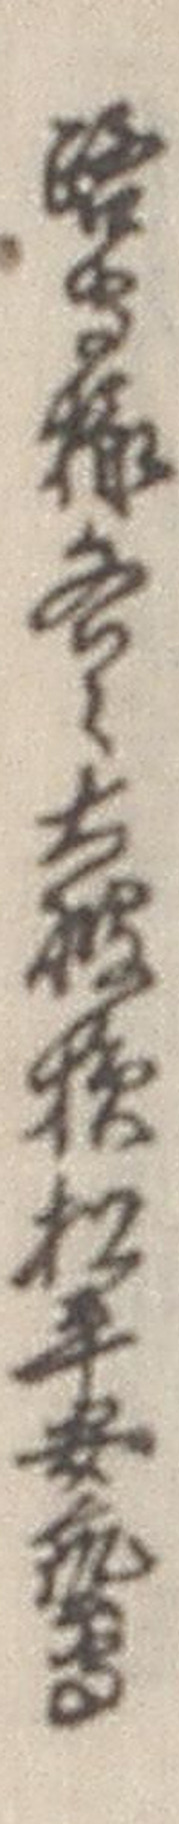路守様各々大破損松平安芸守
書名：江戸　大地震臣細録　全
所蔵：東京大学地震研究所図書室 Earthquake Research Institute Library, The University of Tokyo, JAPAN
